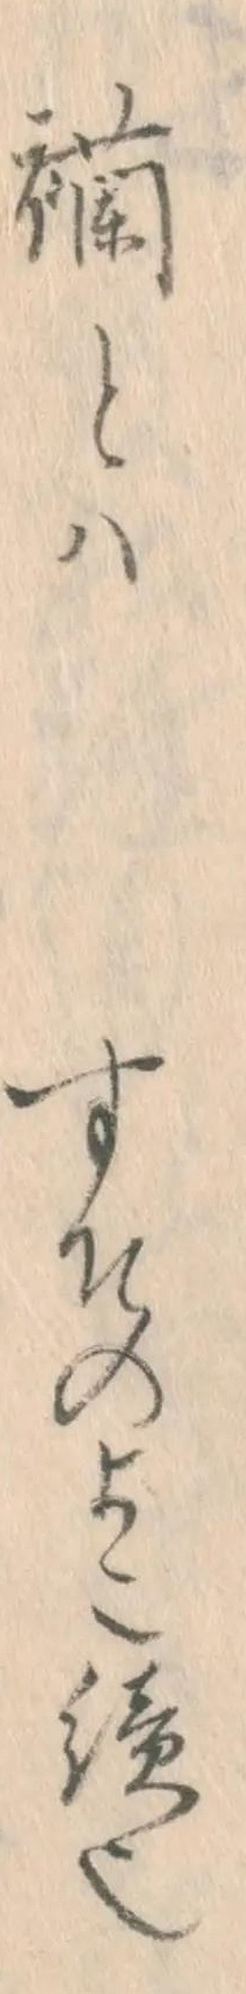襽とハすそのよこ続也
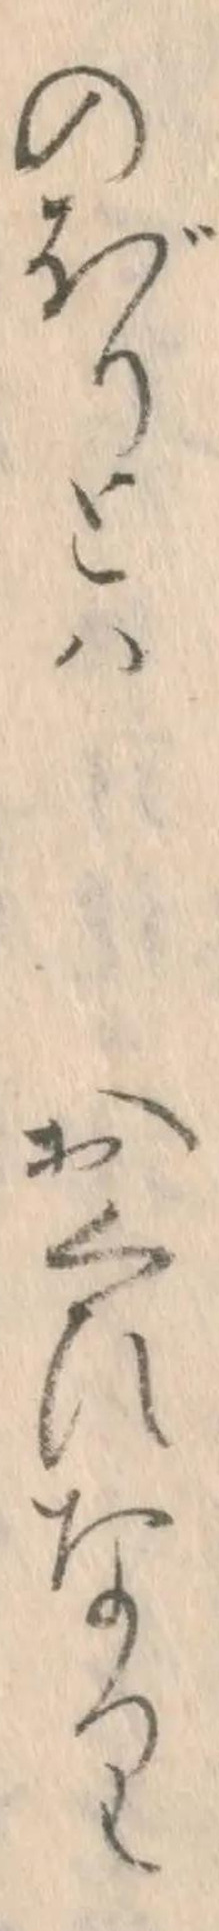のぼりとはおくれひなり
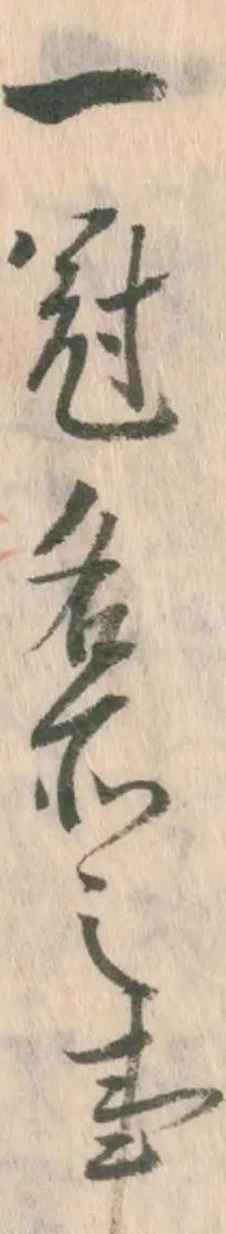一冠名所之事
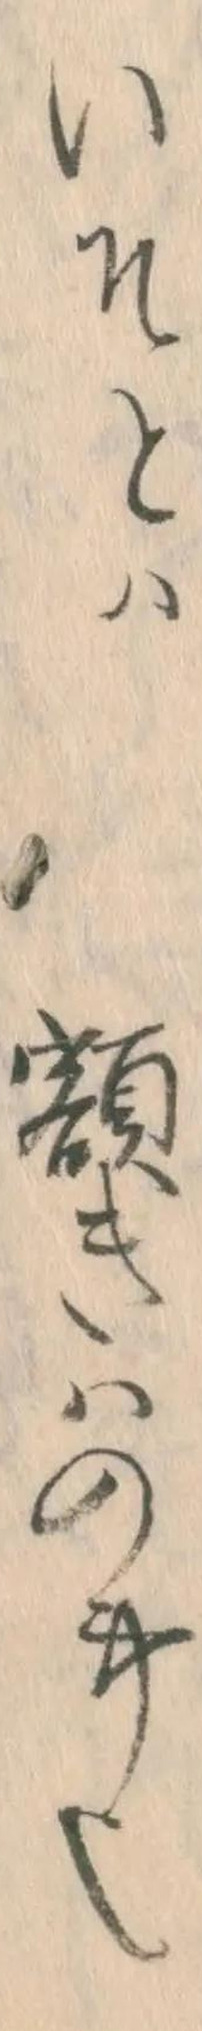いそとハ額きハの事也
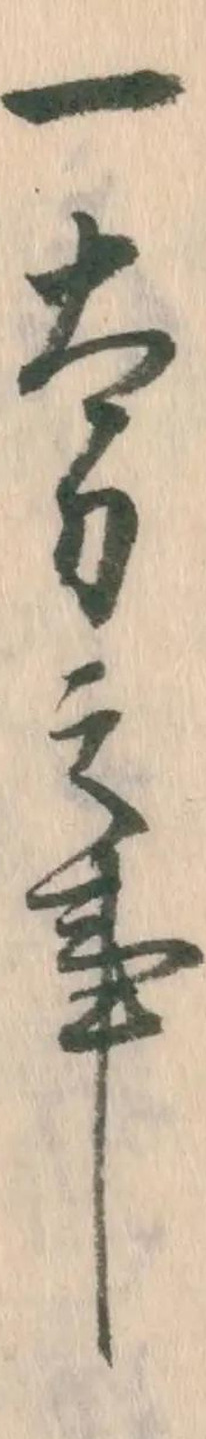一太刀之事
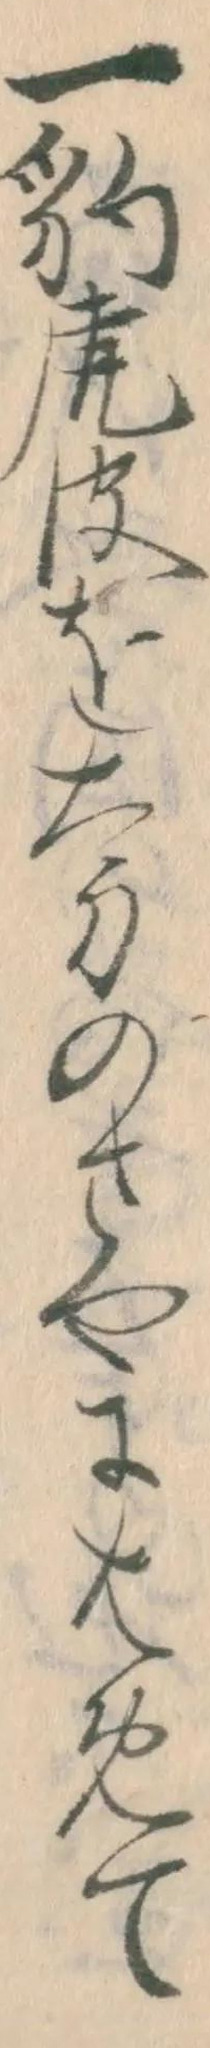一豹虎皮を太刀のさやにはめて
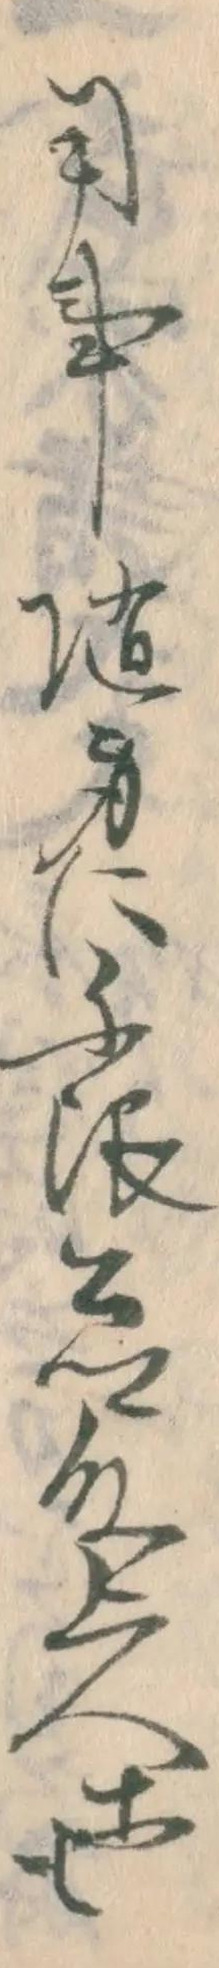用事随身に不限公卿殿上人等も
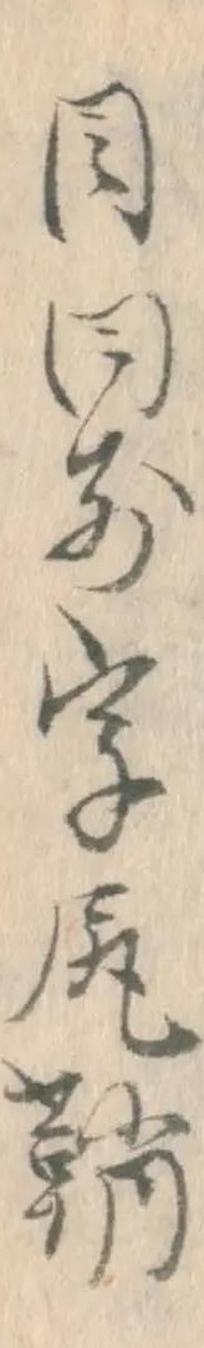目同前字尻鞘
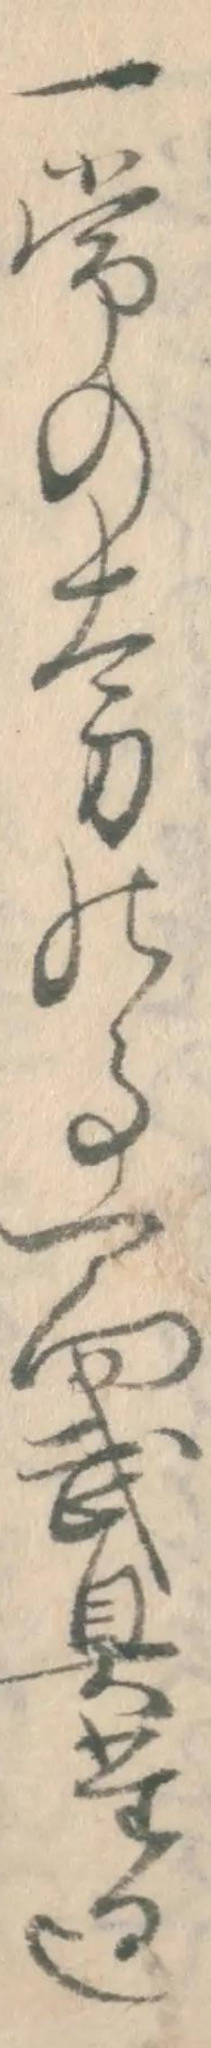一常の太刀の事一向武具たる也
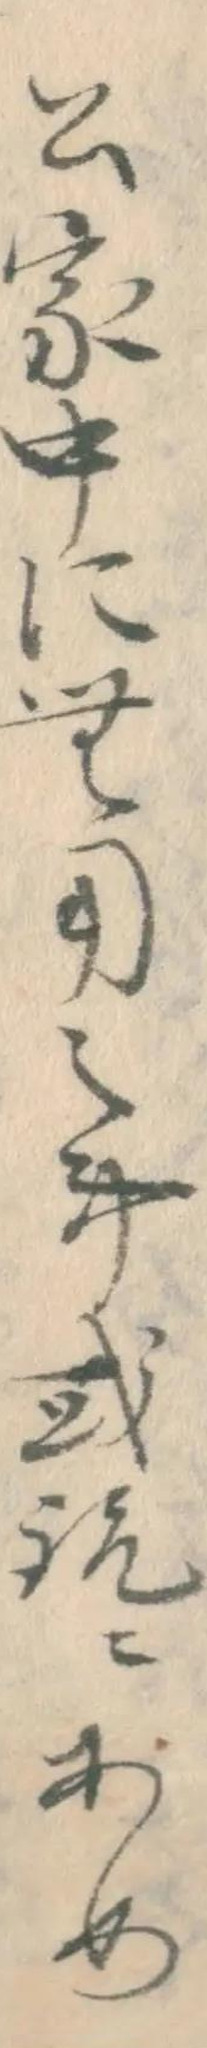公家中に無用之事或説ニあめ
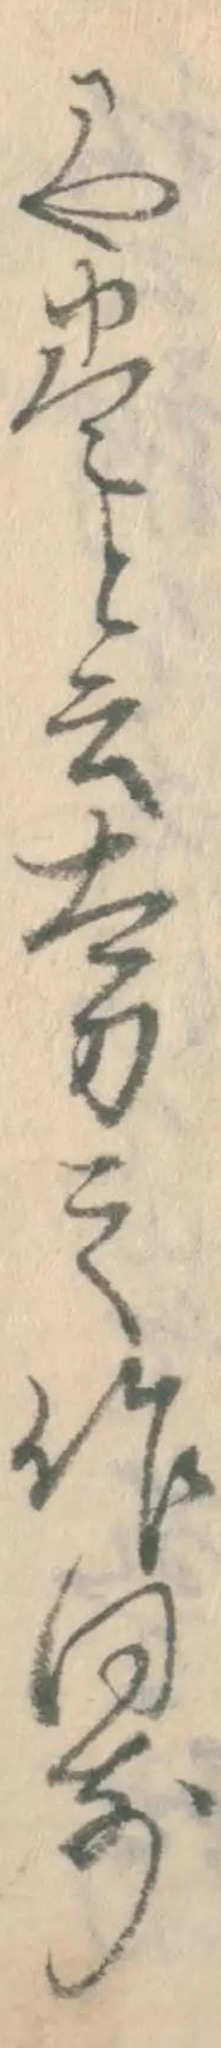さや巻と云太刀之作同前

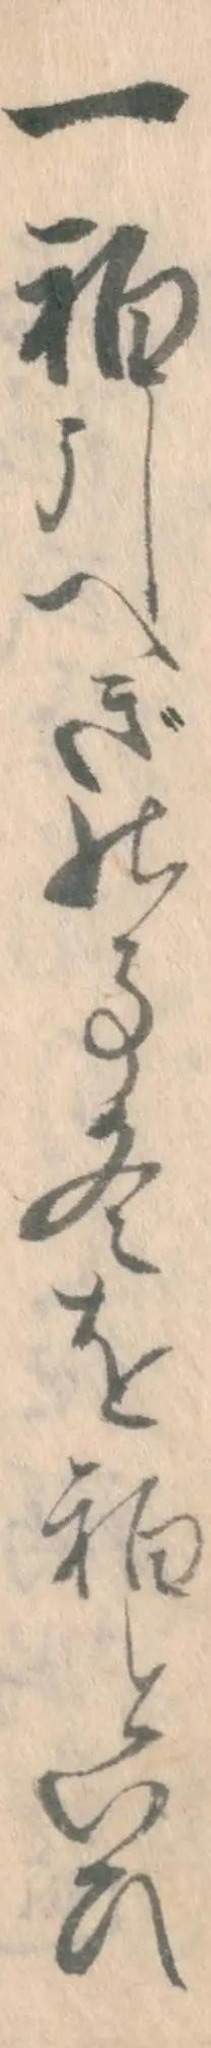一袙引へぎの事冬を袙といひ
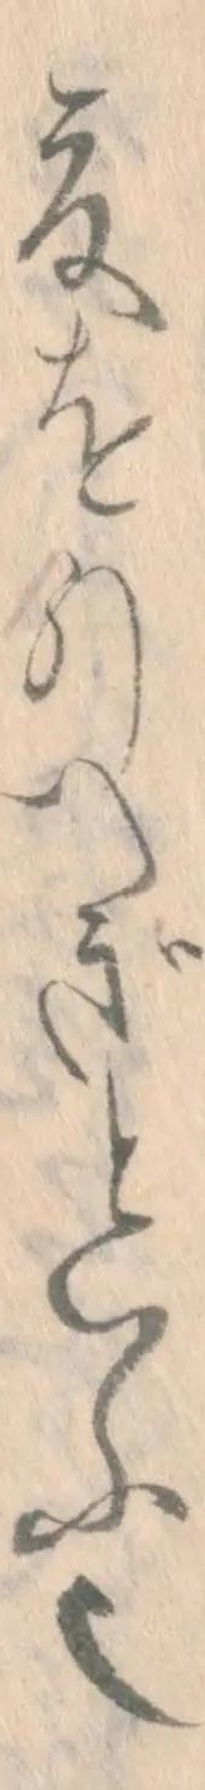夏を引へぎといふ也
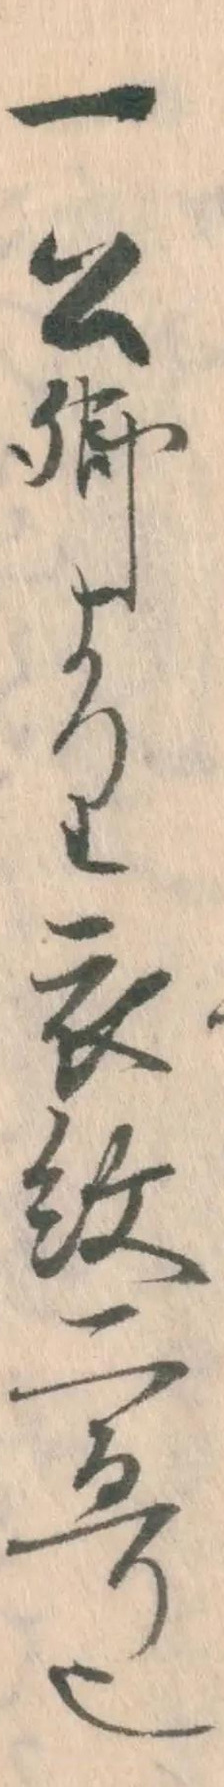一公卿より衣紋二ゑり也
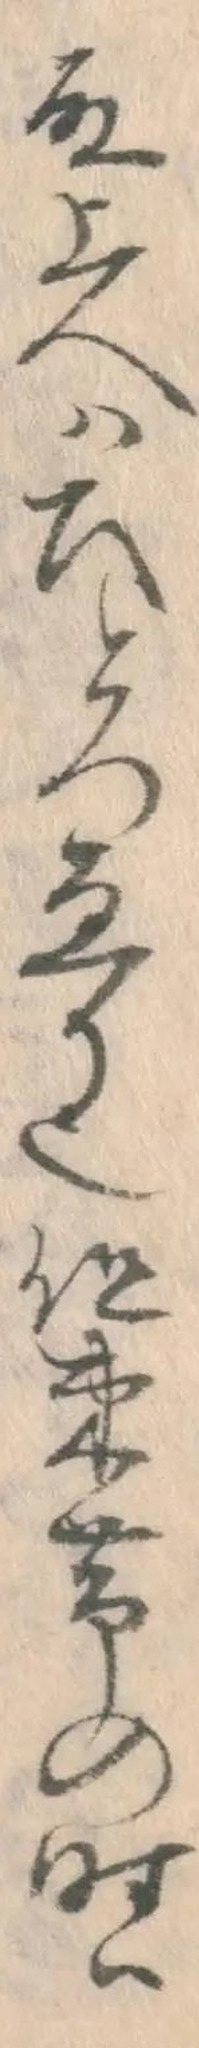殿上人ハひとつゑり也但束帯の時は
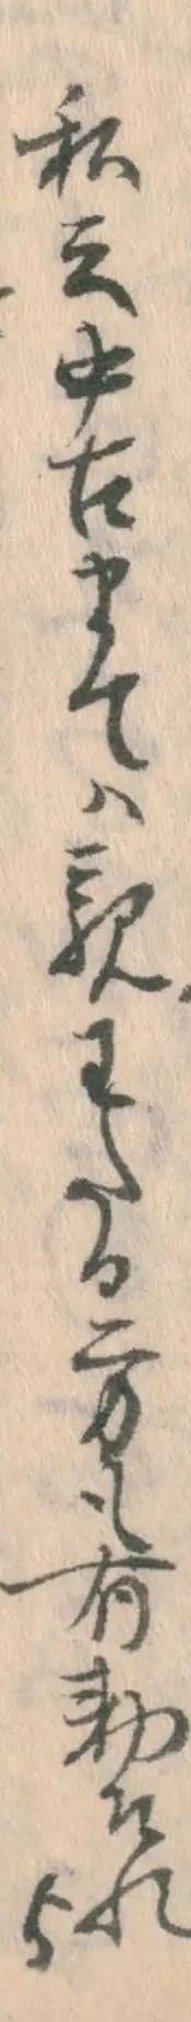私云中古まてハ親王たる方も有勅それゟ
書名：賀茂社記録. 第80冊
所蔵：国立国会図書館 National Diet Library, JAPAN
